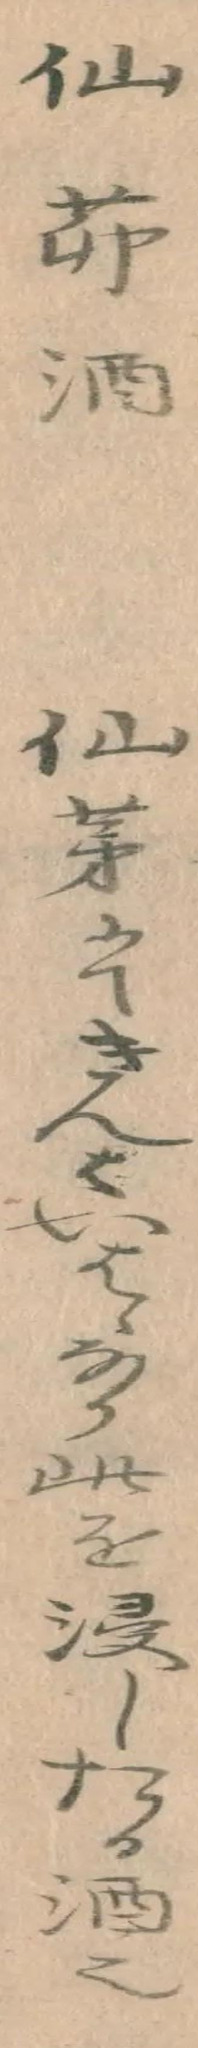仙茆酒仙茅にてきんはいさゝなり此を浸したる酒也
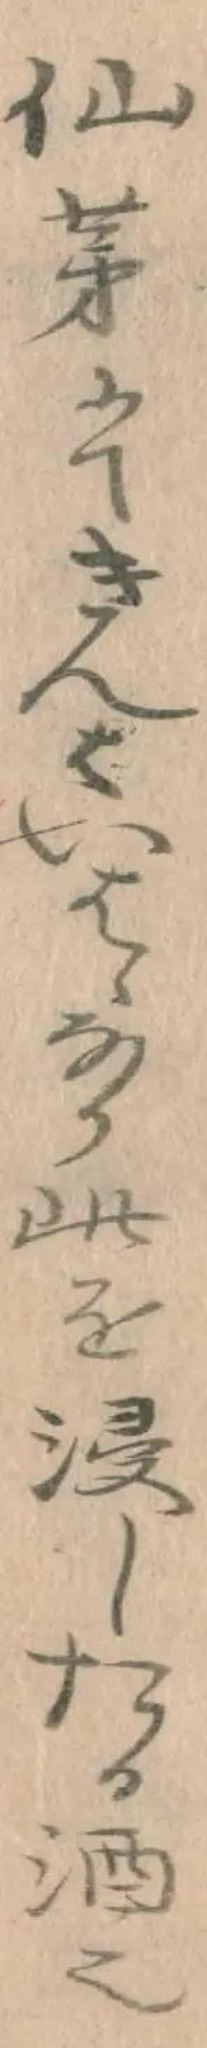仙茆酒仙茅にてきんはいさゝなり此を浸したる酒也
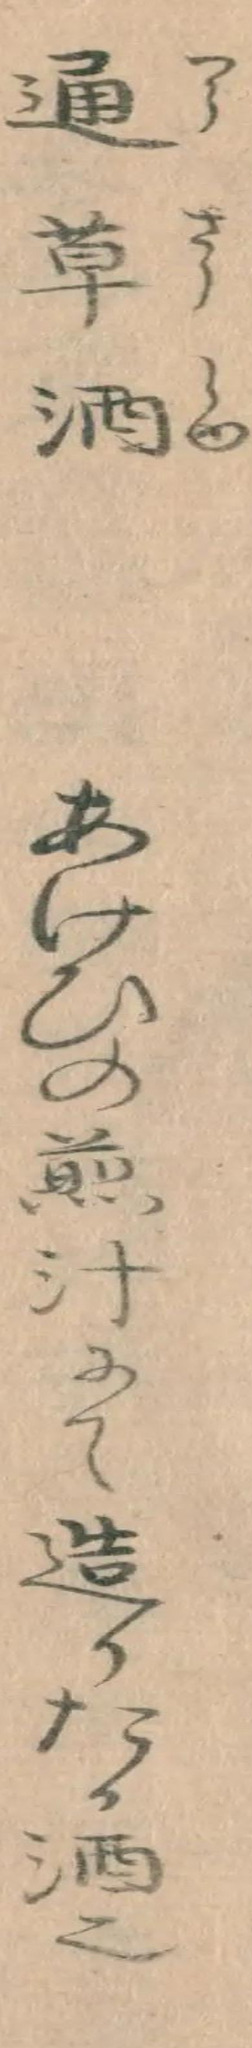通草酒あけひの煎汁にて造りたる酒也
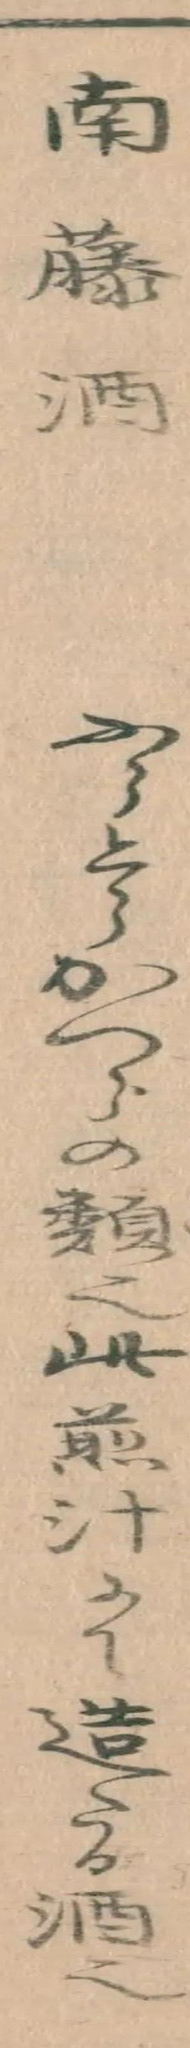南藤酒ふうとうかつらの類也此煎汁にて造たる酒也
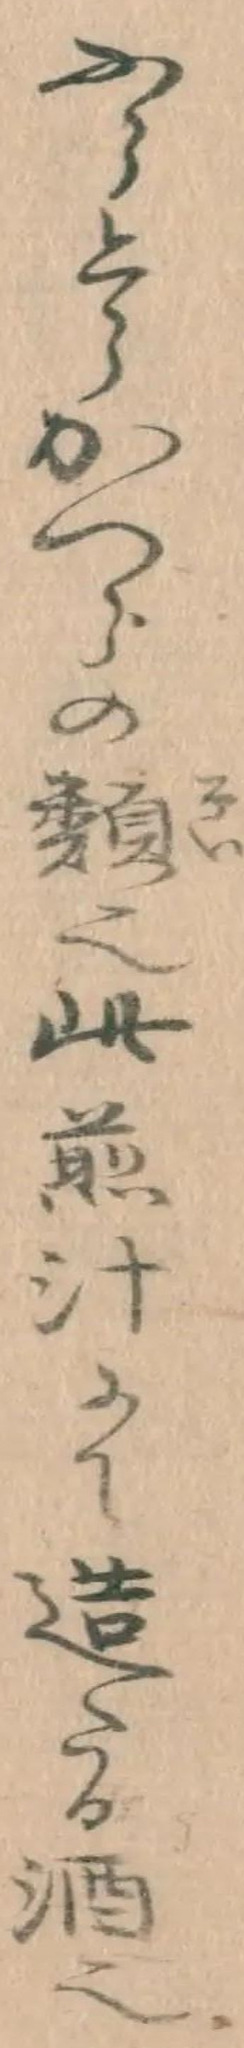南藤酒ふうとうかつらの類也此煎汁にて造たる酒也
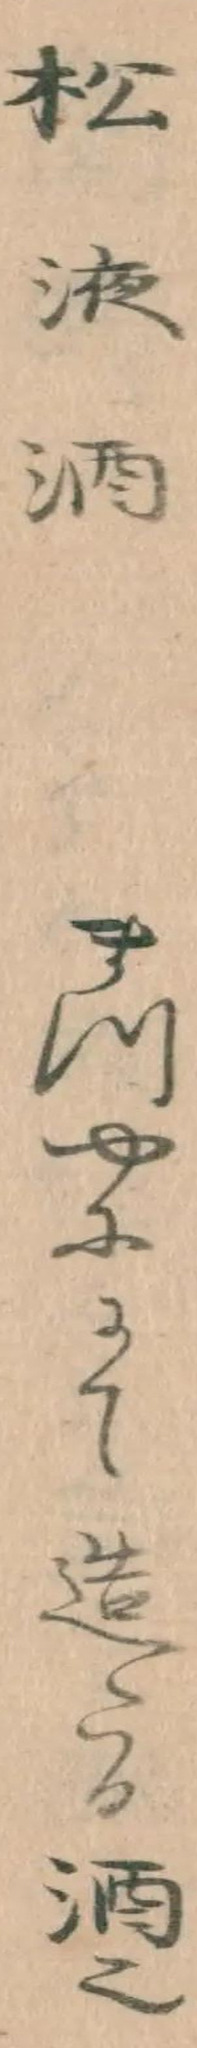松液酒まつやににて造たる酒也
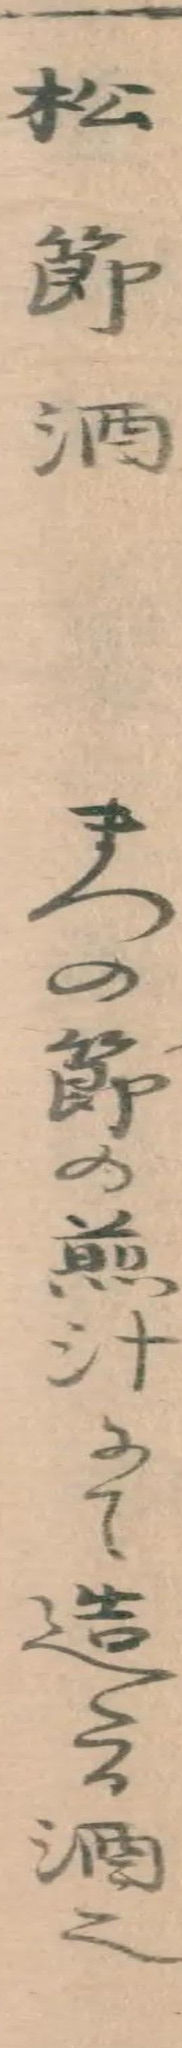松節酒まつの節の煎汁にて造たる酒也
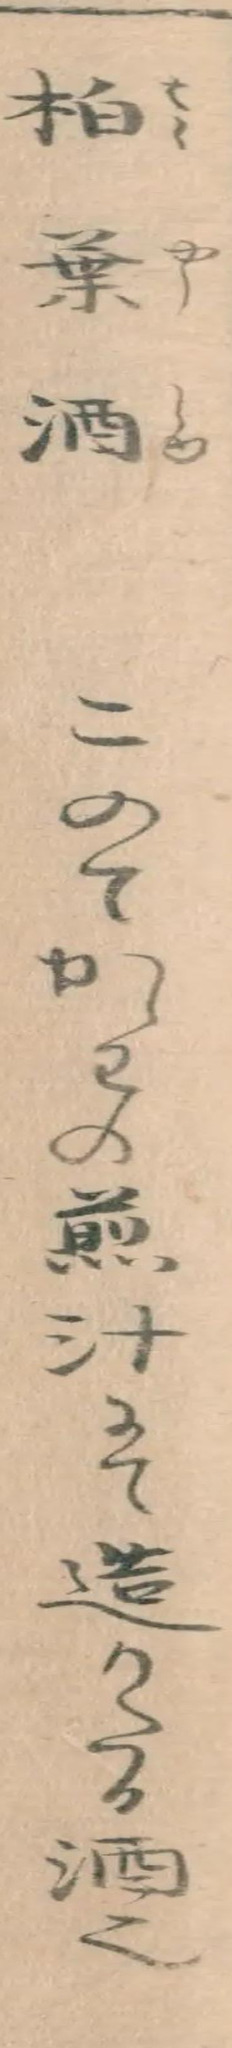柏葉酒このてかしわの煎汁にて造りたる酒也
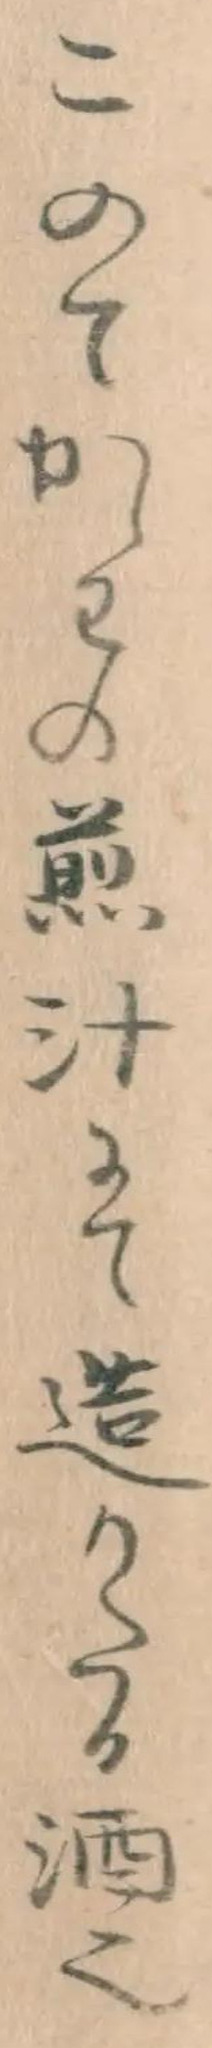柏葉酒このてかしわの煎汁にて造りたる酒也
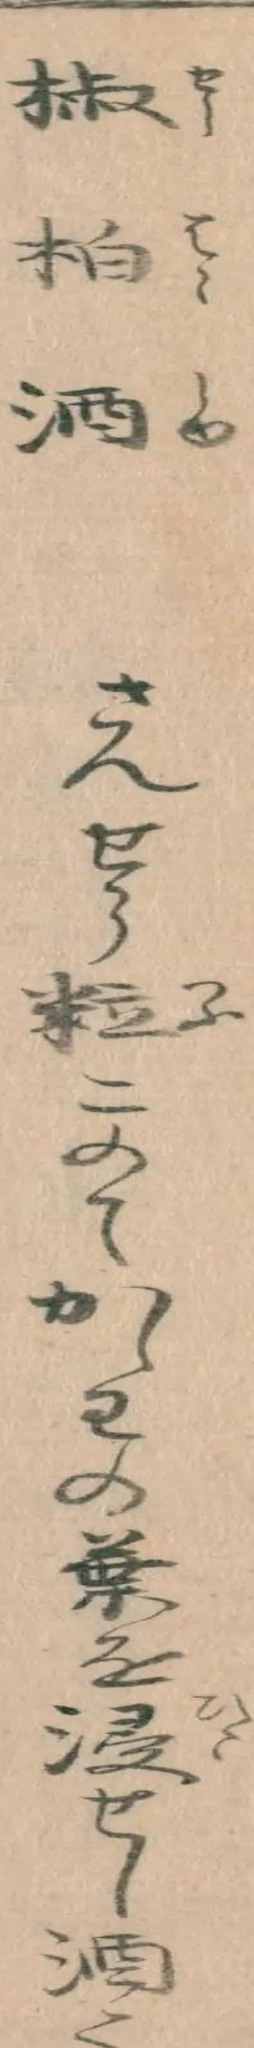椒柏酒さんせう粒このてかしわの葉を浸せし酒也
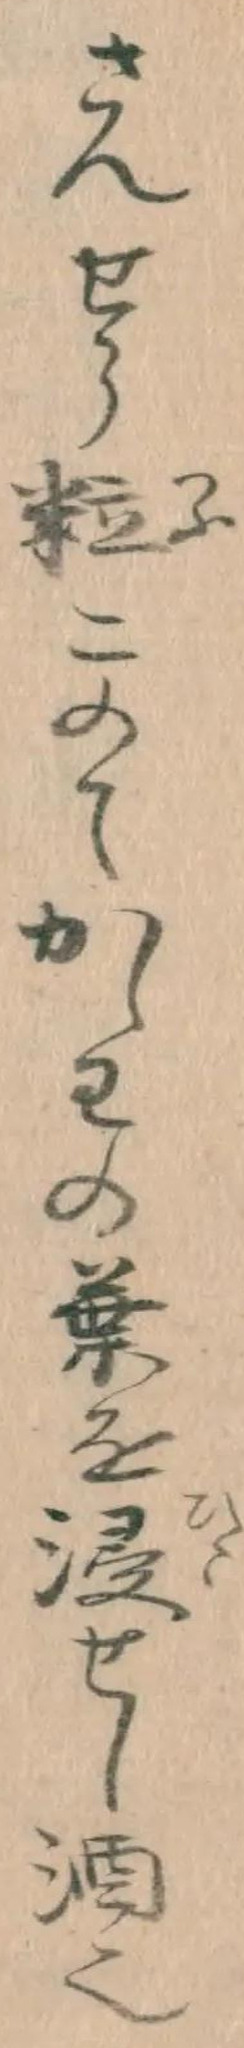椒柏酒さんせう粒このてかしわの葉を浸せし酒也
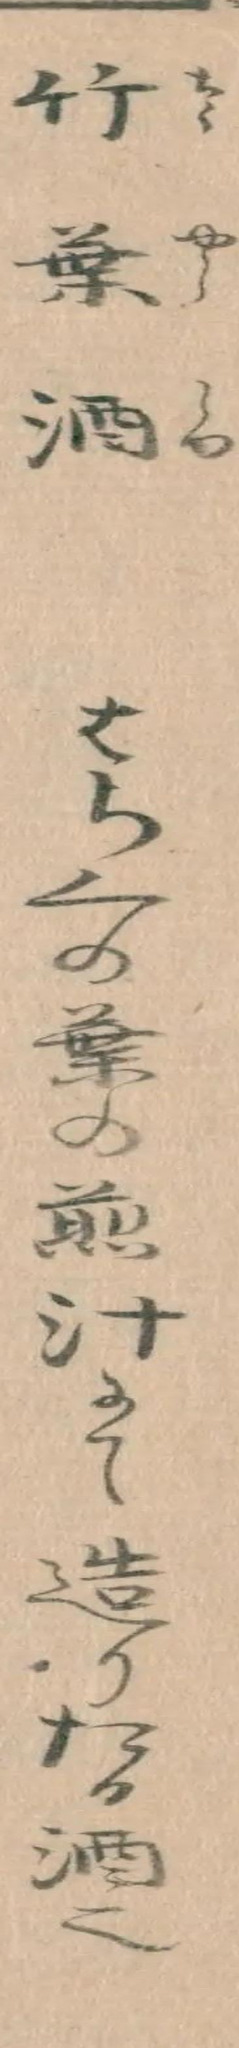竹葉酒はちくの葉の煎汁にて造りたる酒也
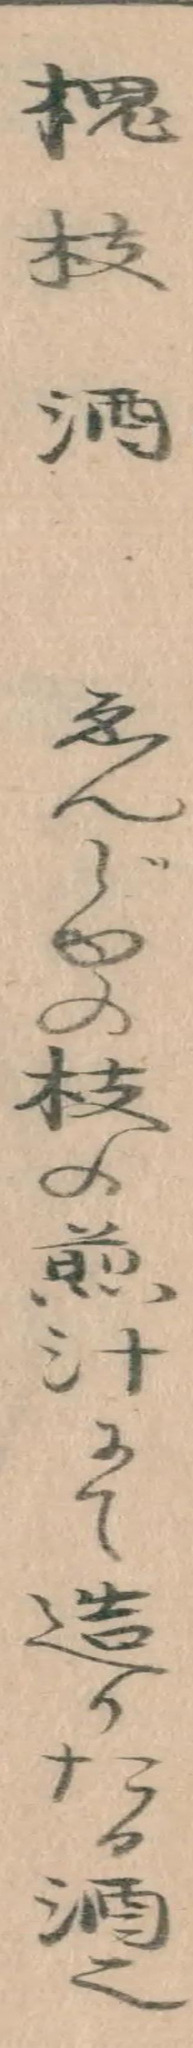槐枝酒ゑんじゆの枝の煎汁にて造りたる酒也
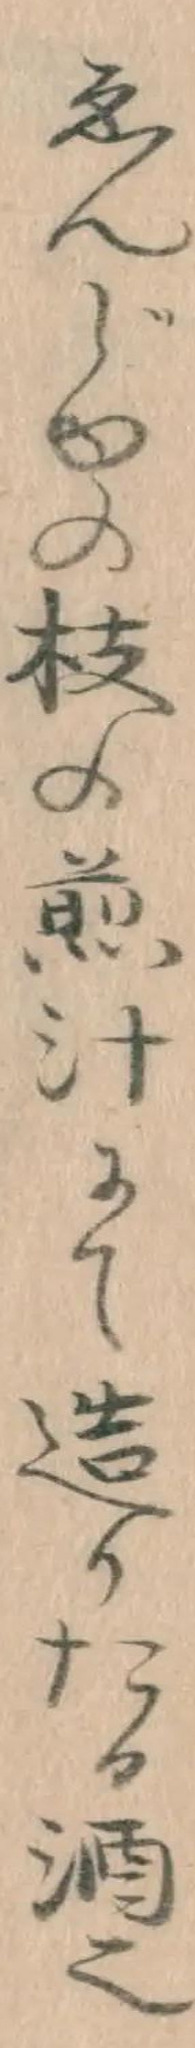槐枝酒ゑんじゆの枝の煎汁にて造りたる酒也
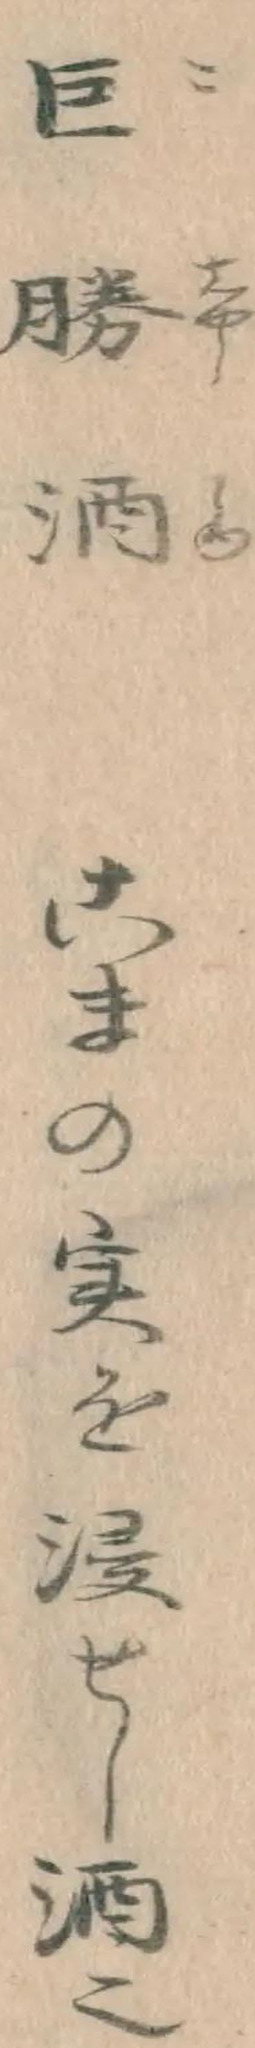巨勝酒こまの実を浸せし酒也
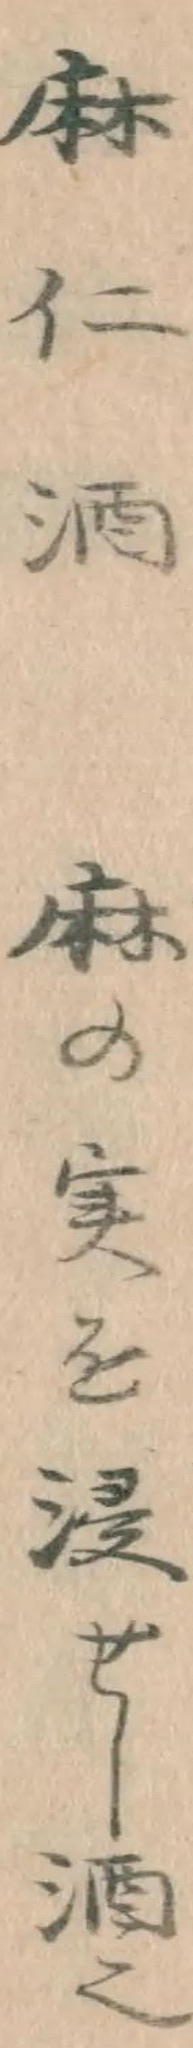麻仁酒麻の実を浸せし酒也
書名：本草図譜. 巻43-45
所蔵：国立国会図書館 National Diet Library, JAPAN
